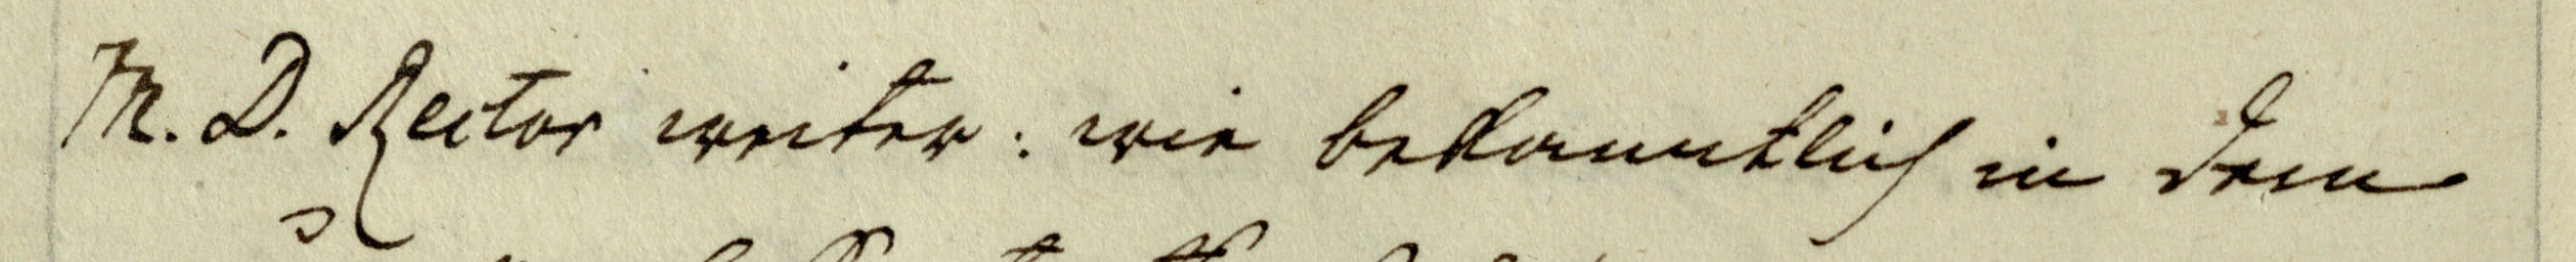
M. D. Rector weiter: wie bekanntlich in dem
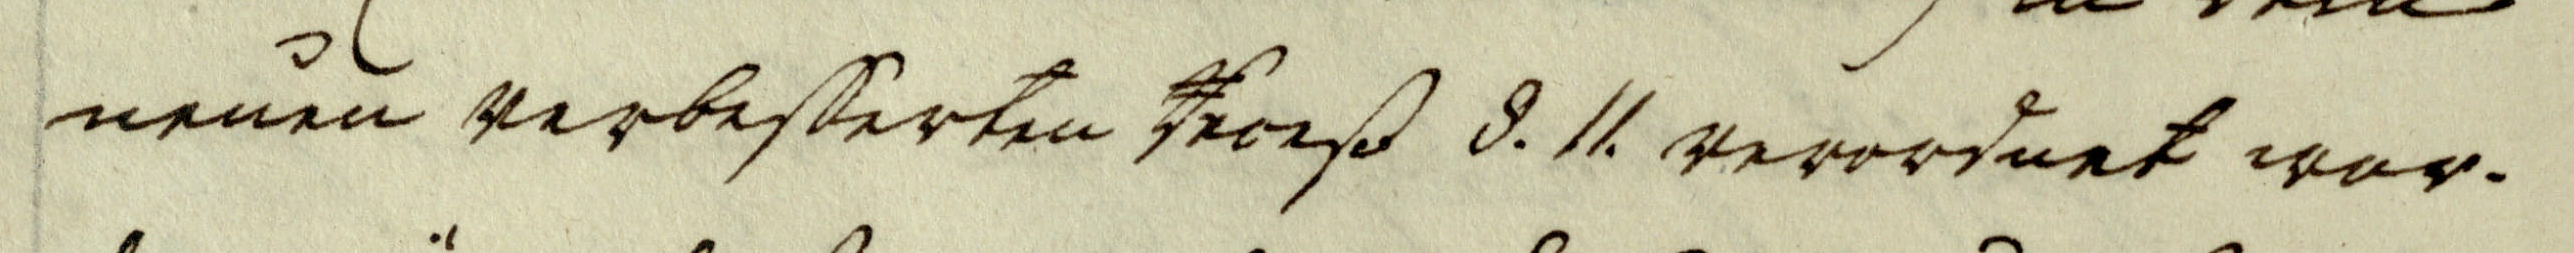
neuen verbesserten Receß §. 11. verordnet wor-
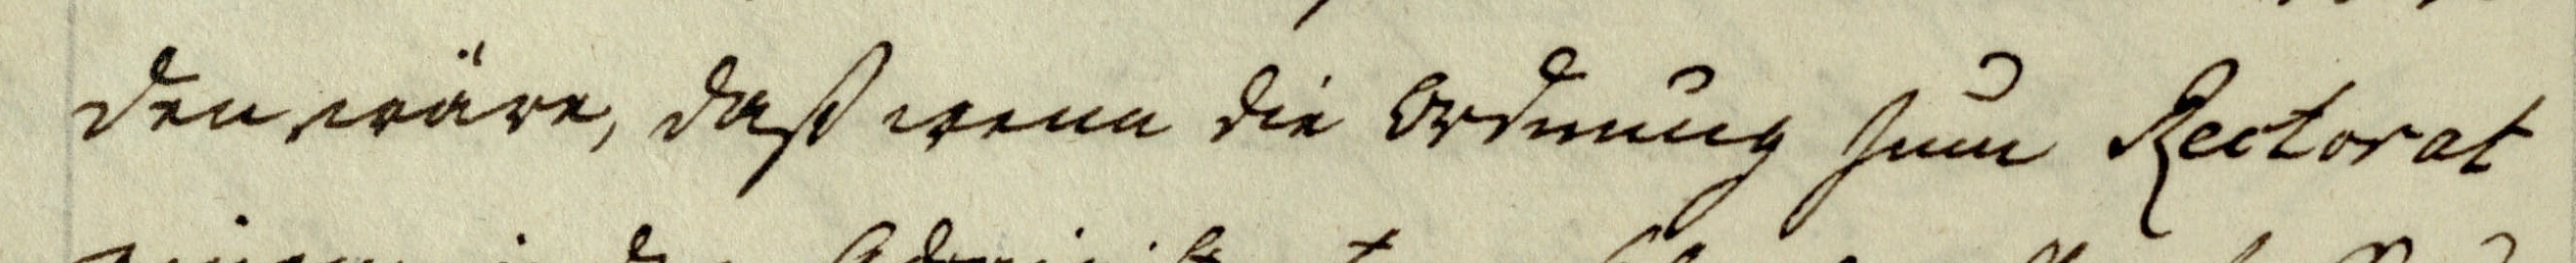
den wäre, daß wenn die Ordnung zum Rectorat
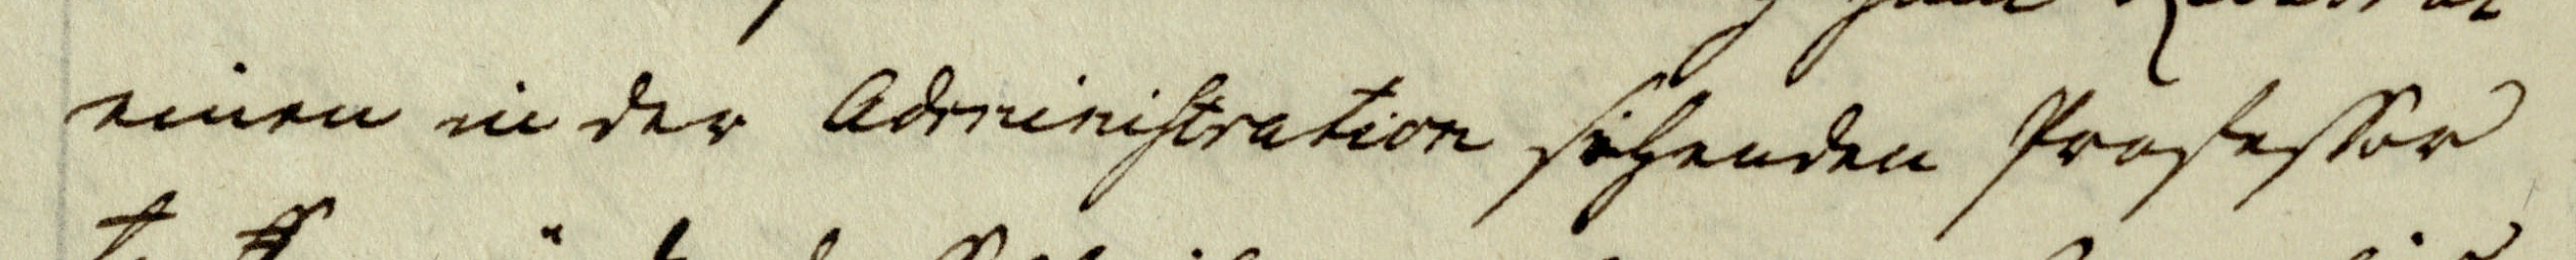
einen in der Administration sitzenden Professor
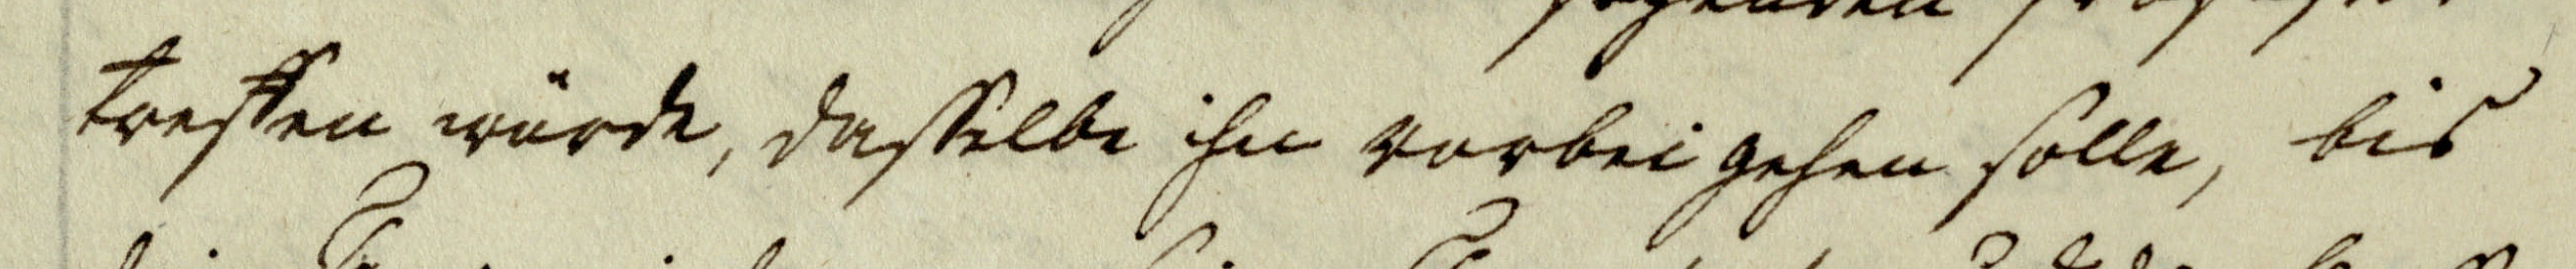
treffen würde, dasselbe ihn vorbei gehen solle, bis
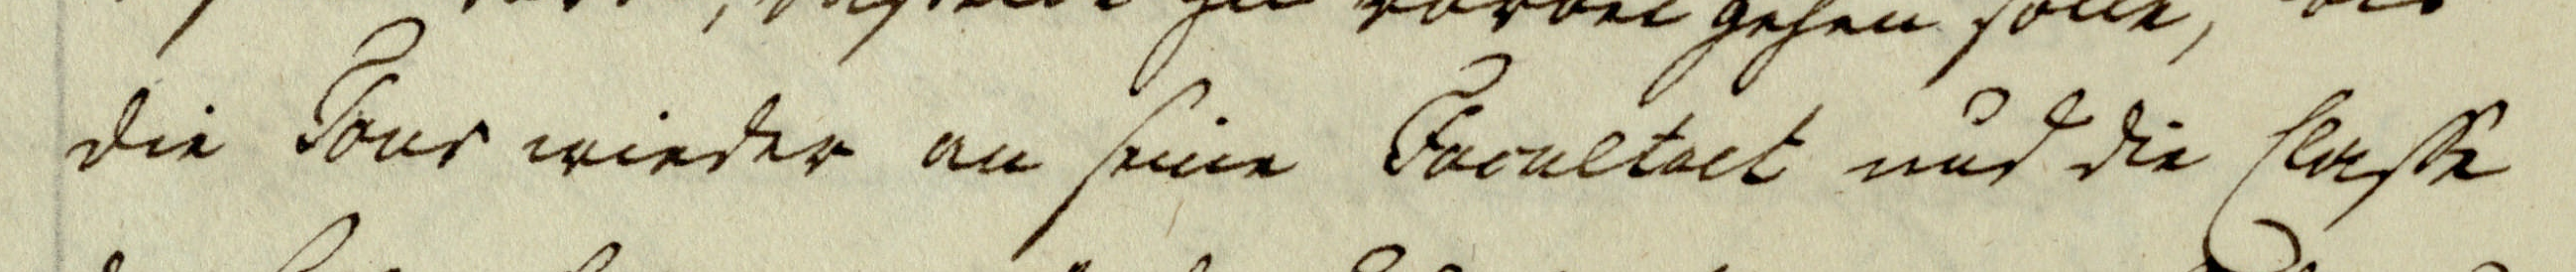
die Tour wieder an seine Facultaet und die Classe
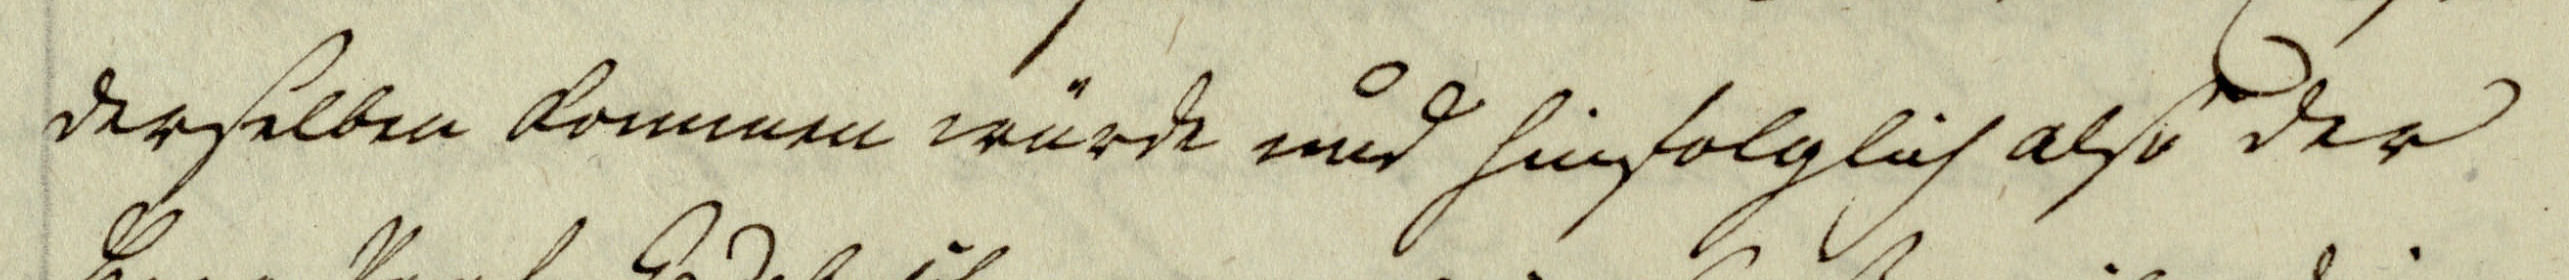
derselben kommen würde und hinfolglich also der
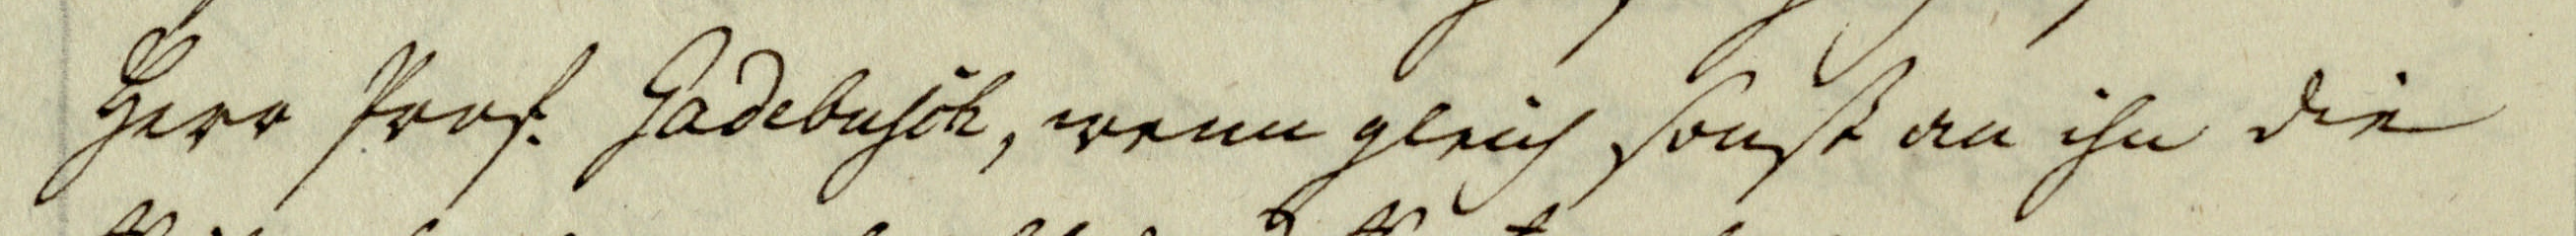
Herr Prof. Gadebusch, wenn gleich sonst an ihn die
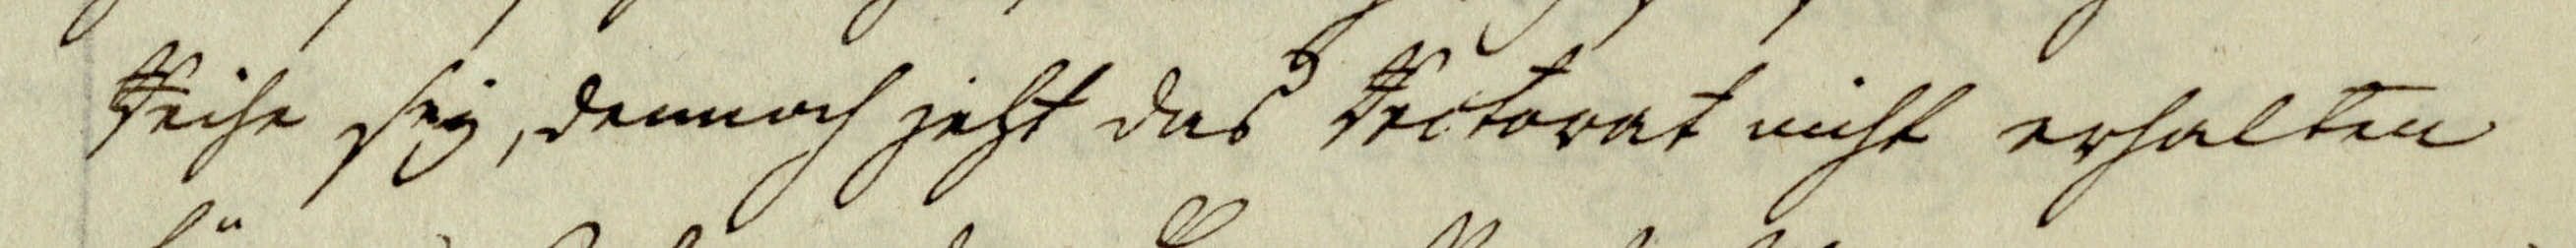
Reihe seÿ, dennoch jetzt das Rectorat nicht erhalten
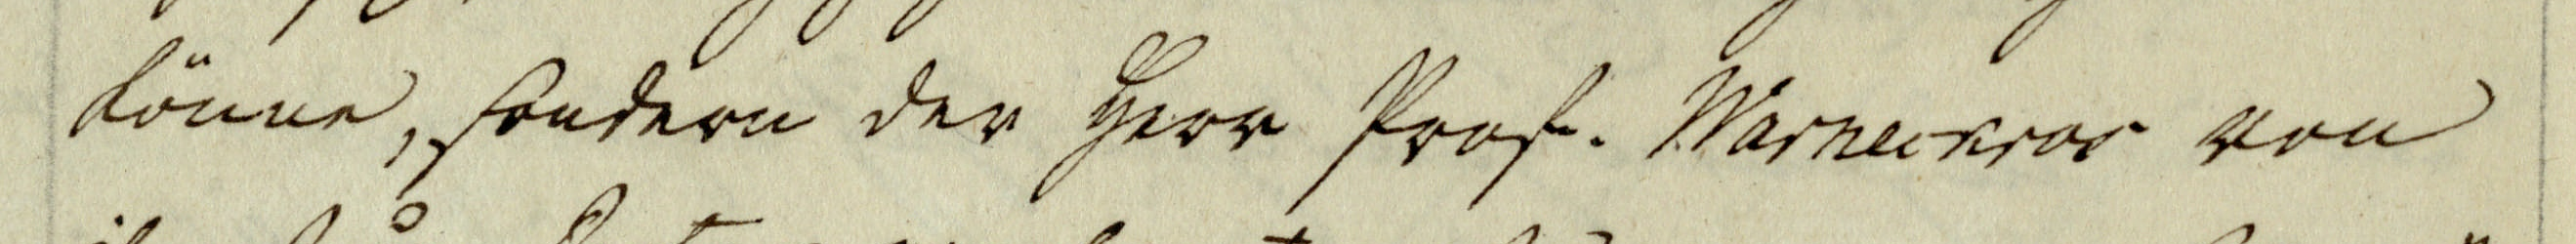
könne, sondern der Herr Prof. Warneckros von
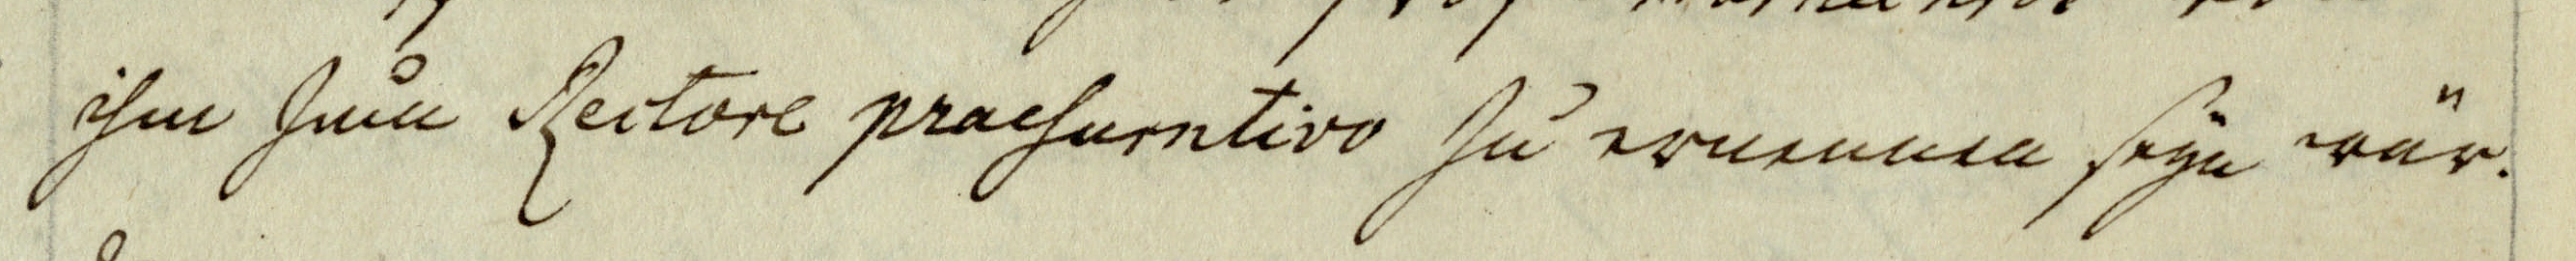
ihm zum Rectore praesumtivo zu ernennem seÿn wür¬
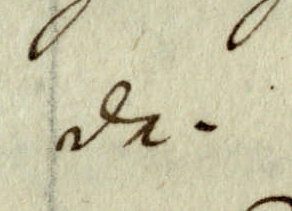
de.
